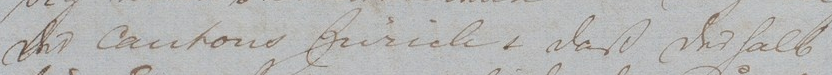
des Cantons Zürich & daß deshalb
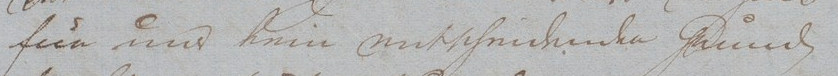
für uns kein entscheidender Grund
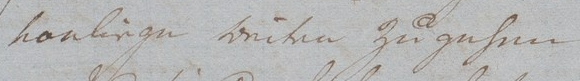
vorliege weiter zu gehen. –
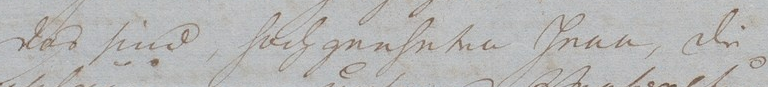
Das sind, hochgeehrter Herr, die
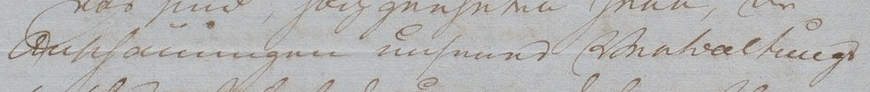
Anschauungen unseres Verwaltungs-
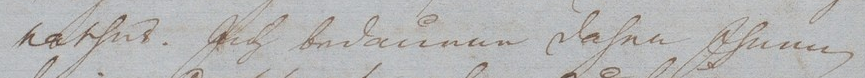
rathes. Ich bedauere daher Ihnen
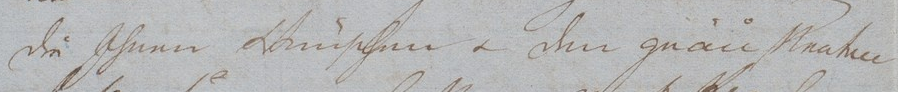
die Ihren Wünschen & den geäußerten
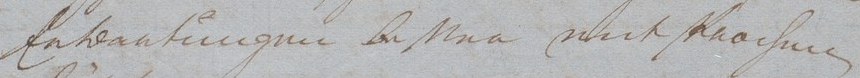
Erwartungen besser entsprochen
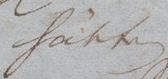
hätten. –
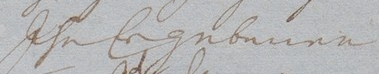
Ihr Ergebener
